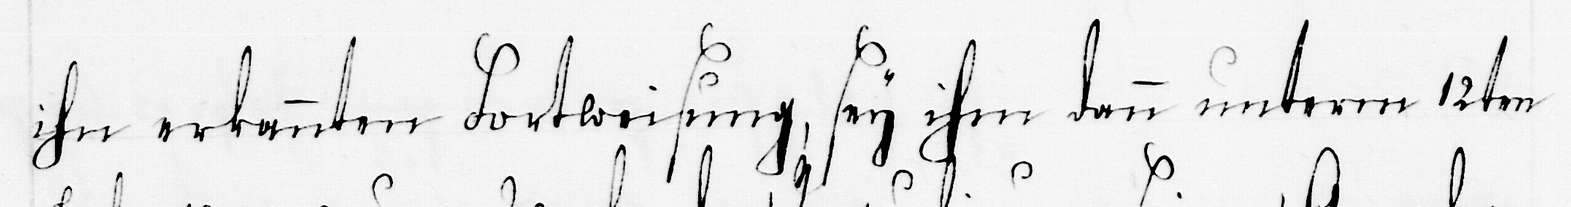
ihn erkannten Fortweisung, sey ihm dann unterm 12ten
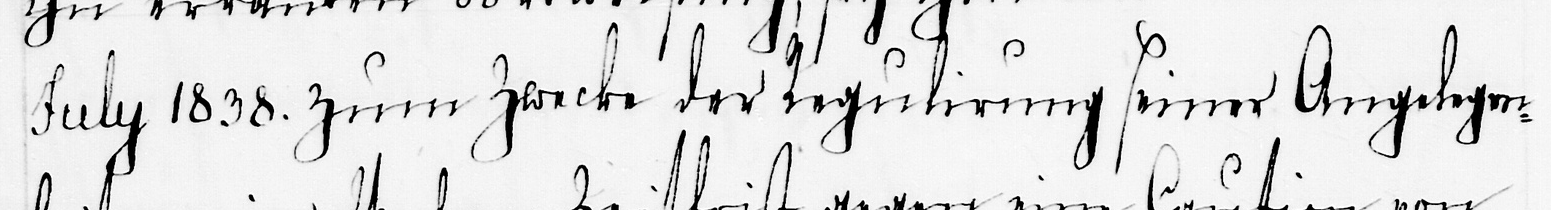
July 1838. zum Zwecke der Regulirung seiner Angelegen¬
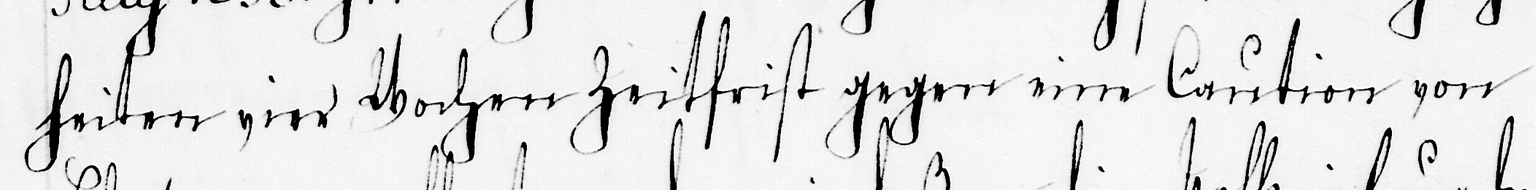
heiten vier Wochen Zeitfrist gegen eine Caution von
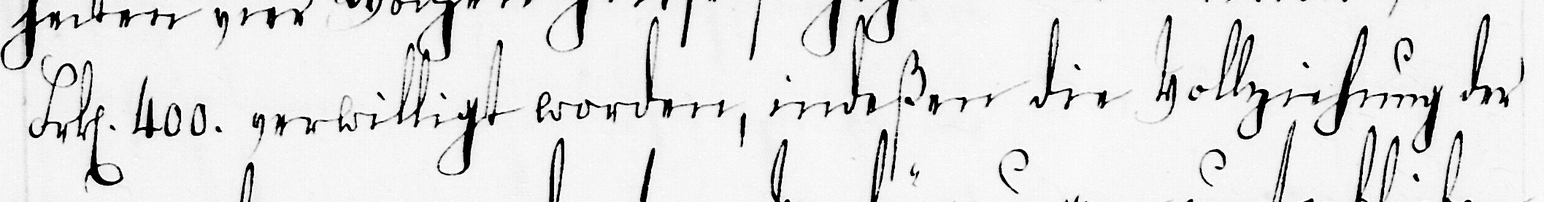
k[en]. 400. verwilligt worden, indeßen die Vollziehung der
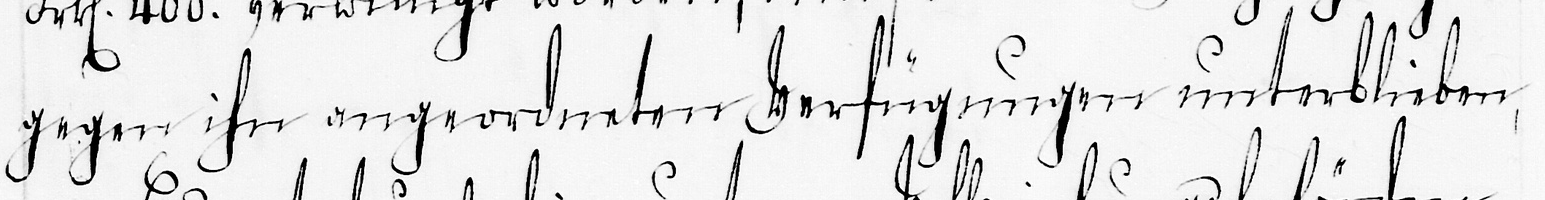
gegen ihn angeordneten Verfügungen unterblieben,
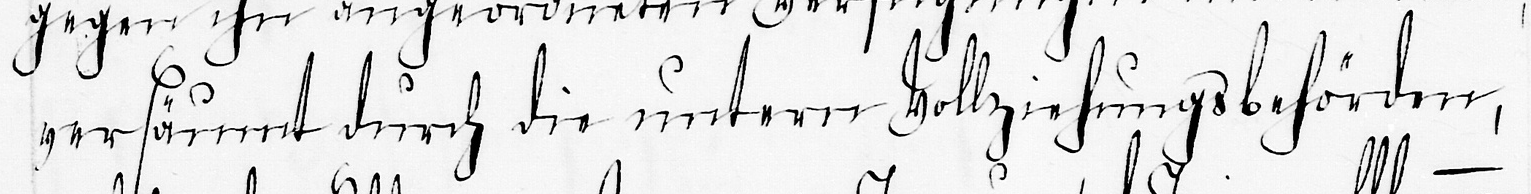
versäumt durch die untern Vollziehungsbehörden,
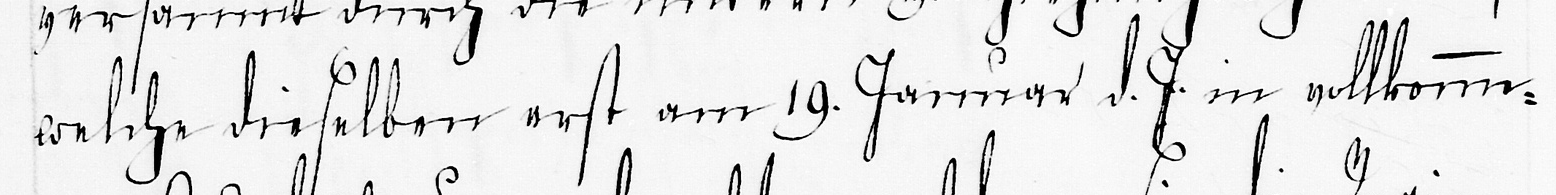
welche dieselben erst am 19. Januar d. J. in vollkomme¬
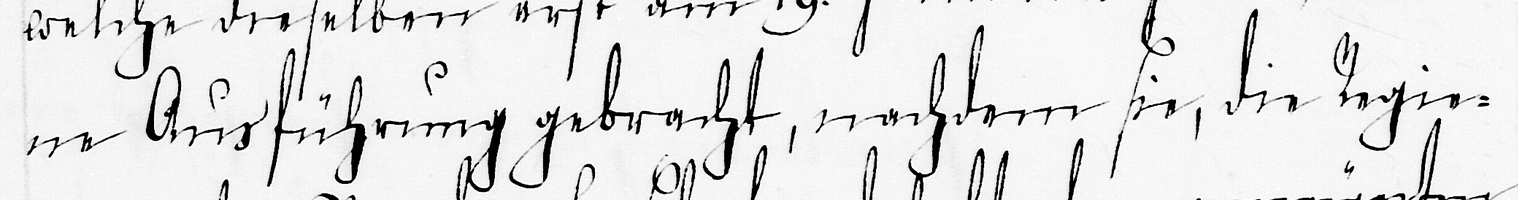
ne Ausführung gebracht, nachdem sie, die Regie¬
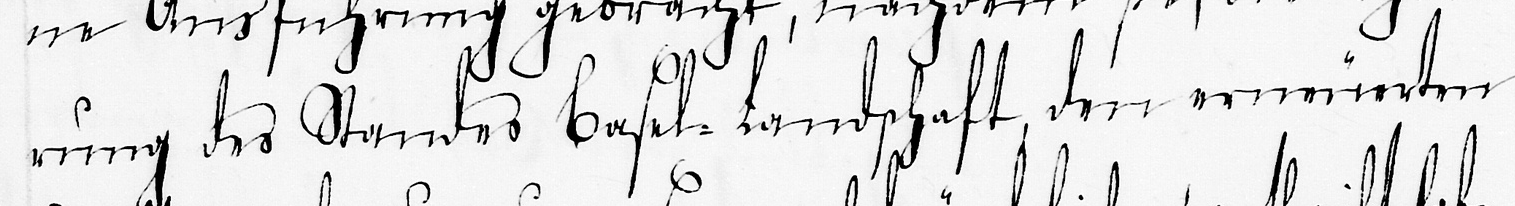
rung des Standes Basel-Landschaft, den erneuerten
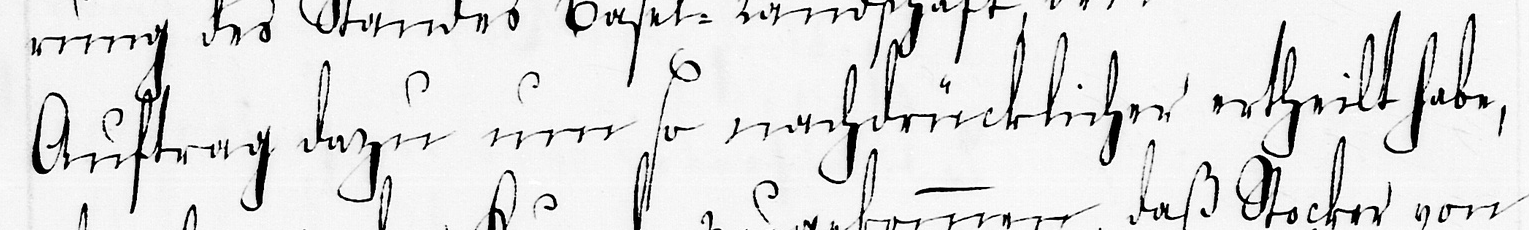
Auftrag dazu um so nachdrücklicher ertheilt habe,
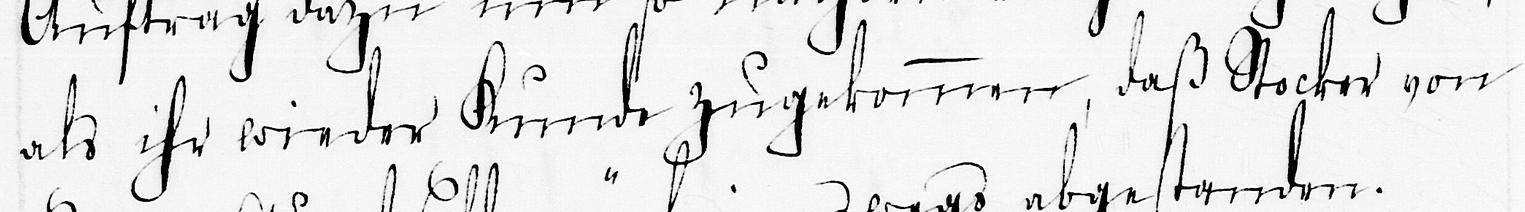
als ihr wieder Kunde zugekommen, daß Stocker von
